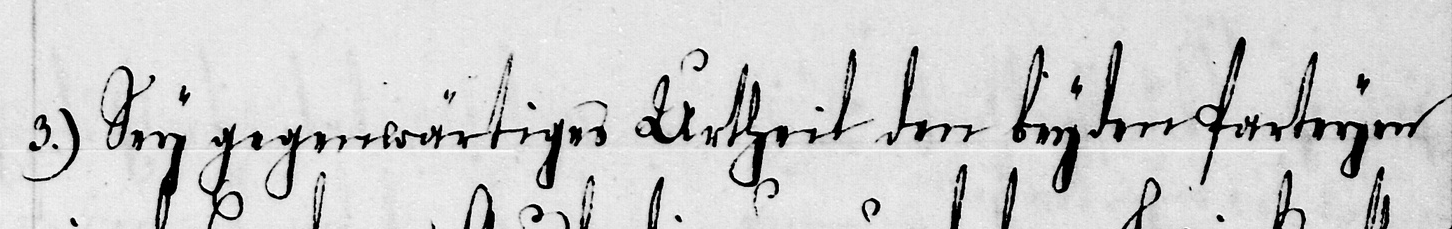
3.) Sey gegenwärtiges Urtheil den beyden Partheyen
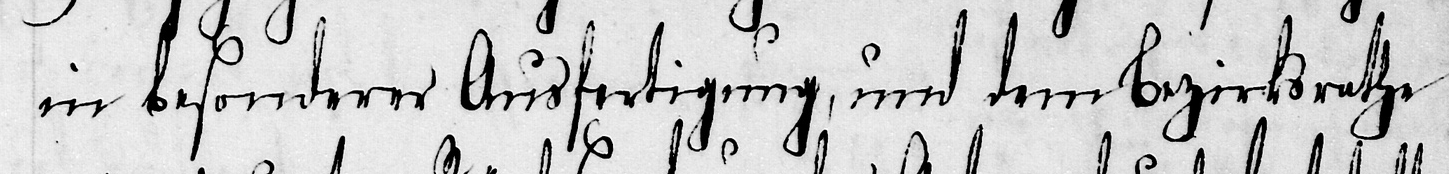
in besonderer Ausfertigung, und dem Bezirksrathe
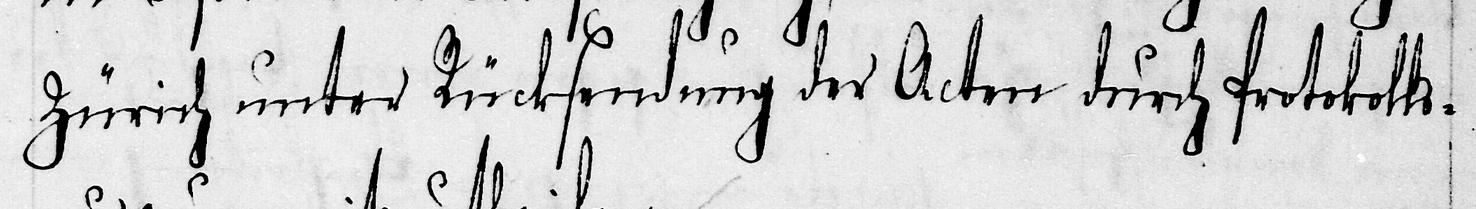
Zürich unter Rücksendung der Acten durch Protokoll¬
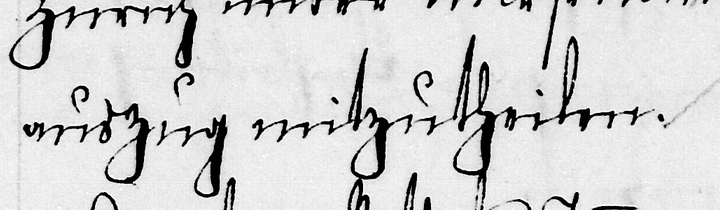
sauszug mitzutheilen.
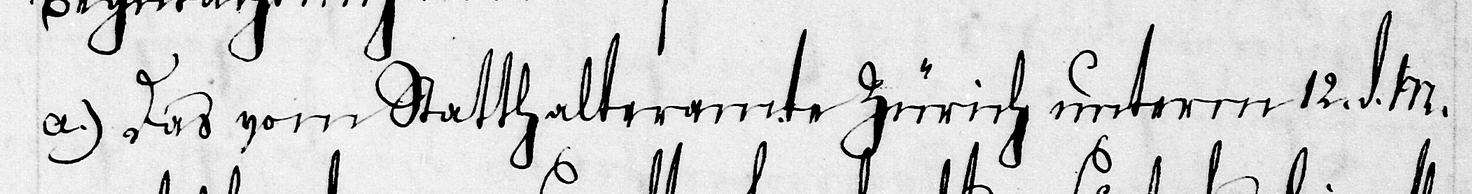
a.) Das vom Statthalteramte Zürich unterm 12. d. M.
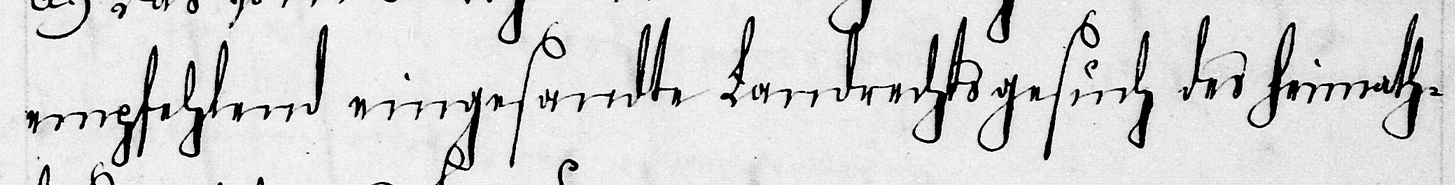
empfehlend eingesandte Landrechtsgesuch des heimath¬
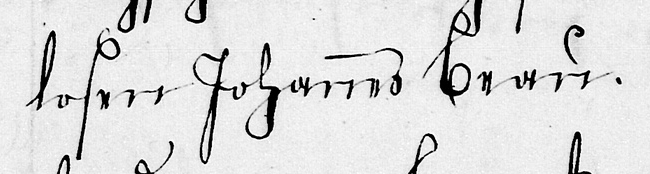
losen Johannes Beau.
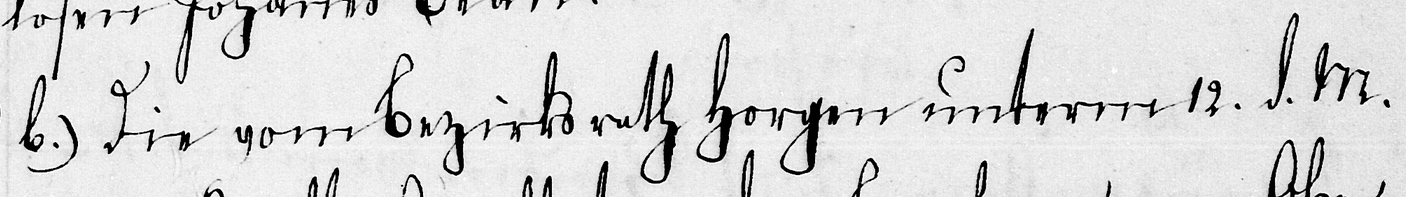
b.) Die vom Bezirksrath Horgen unterm 12. d. M.
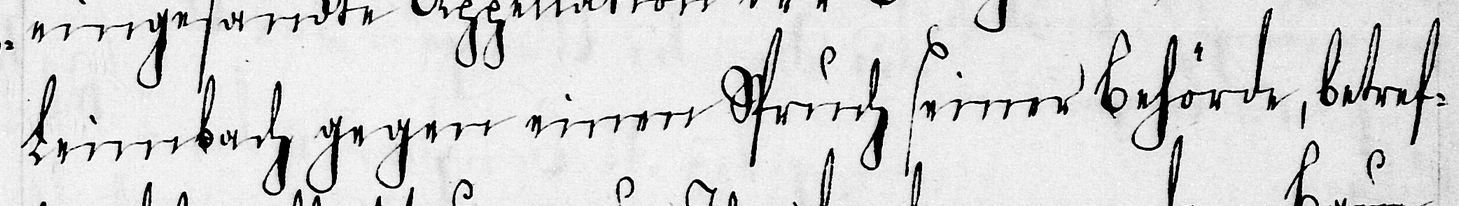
eimbach gegen einen Spruch seiner Behörde, betref¬
